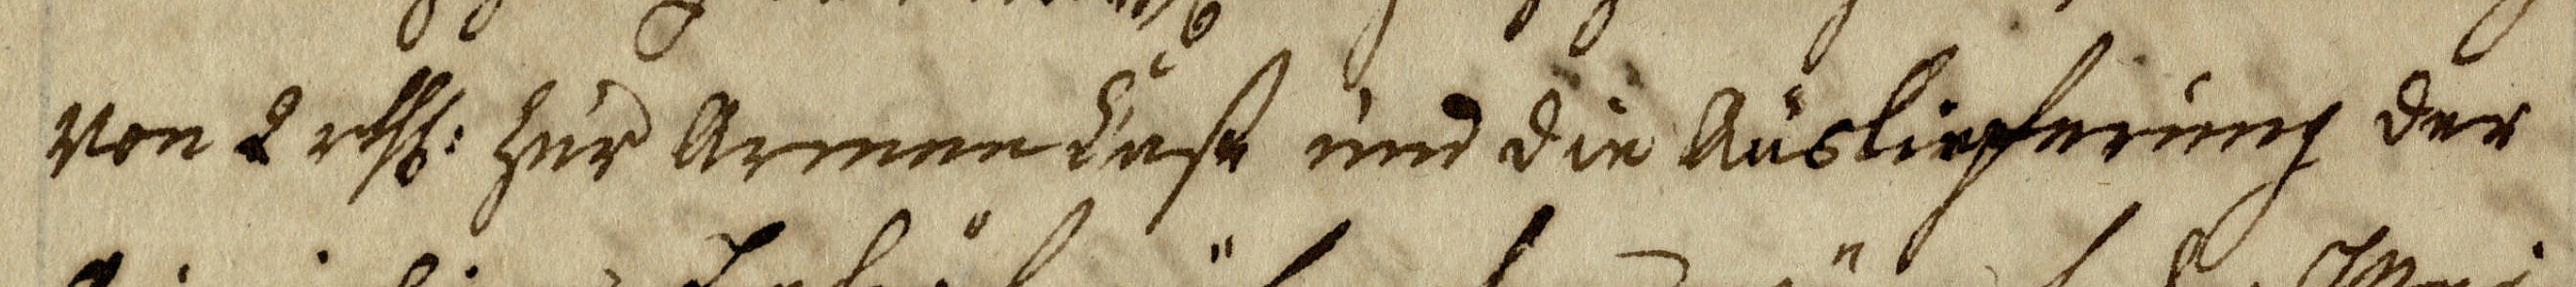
von 2 rtl. zur ArmenCaße und die Auslieferung der
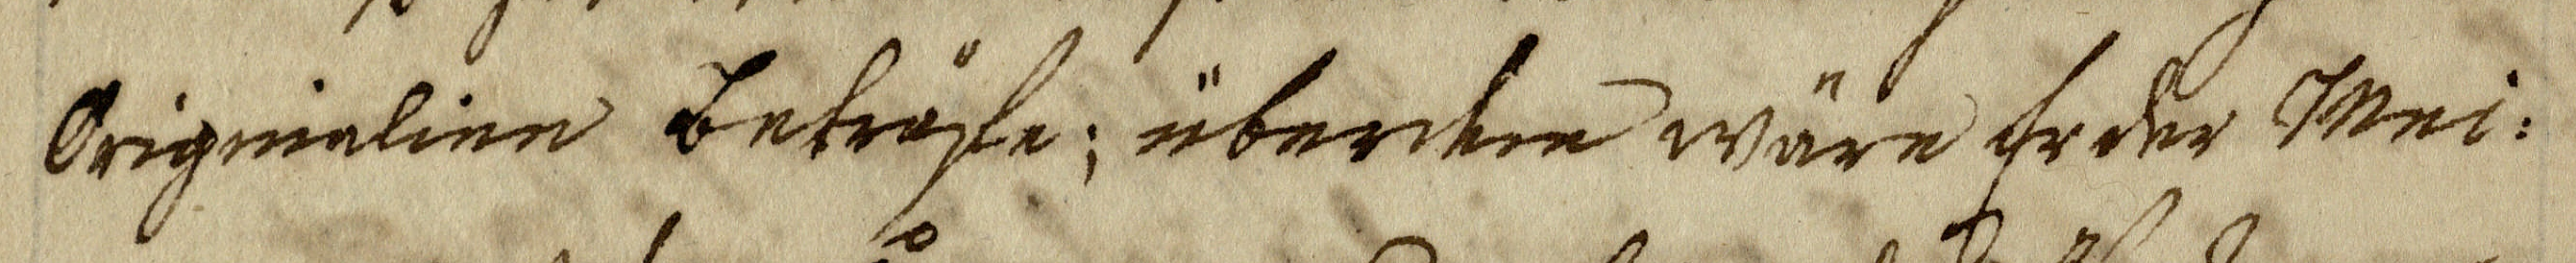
Originalien beträfe, überdem wäre Er der Mei¬
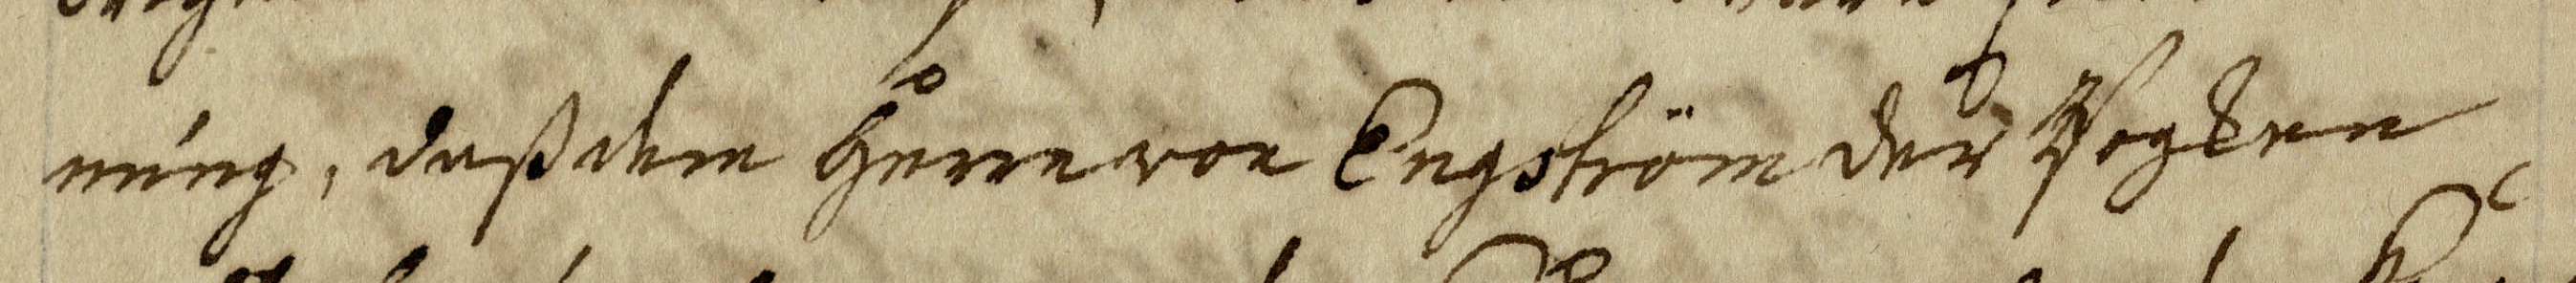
nung, daß dem Herrn von Engström der Rogken
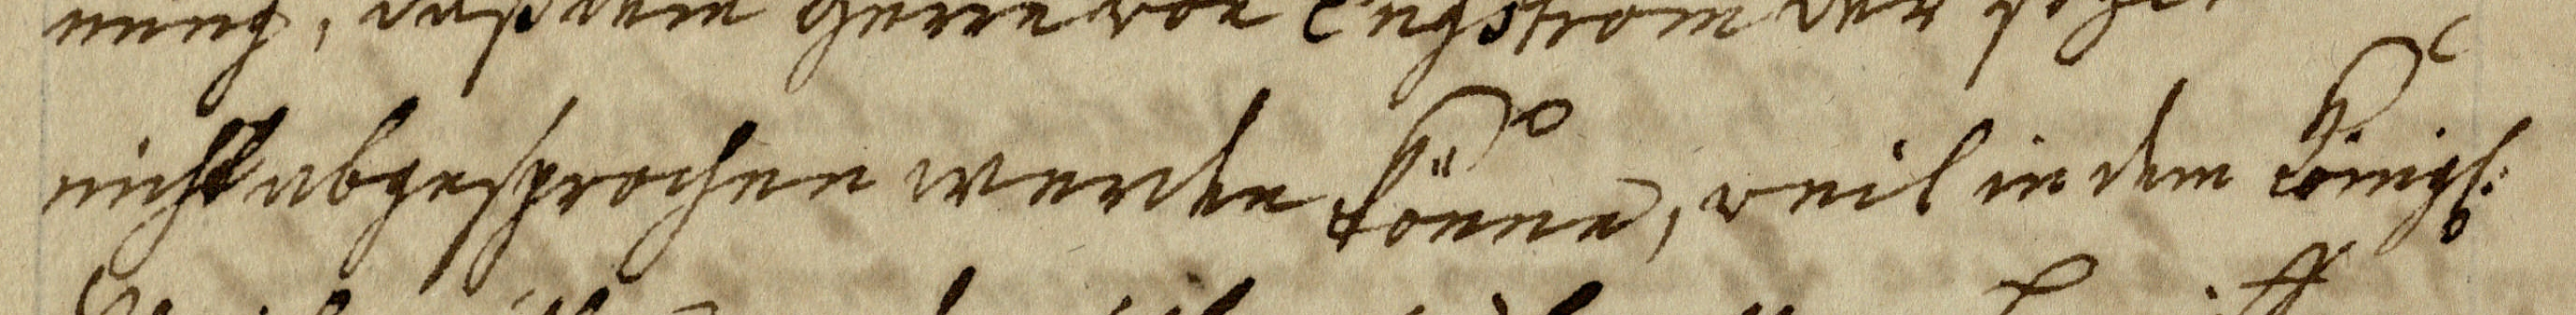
nicht abgesprochen werden könne, weil in dem Königl.
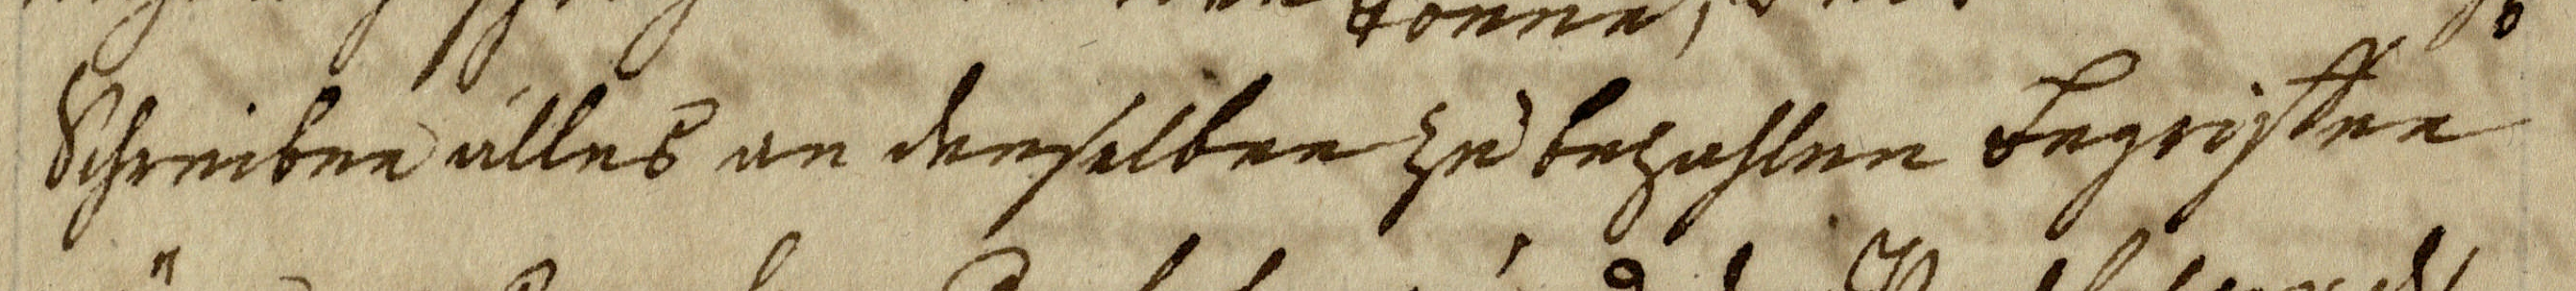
Schreiben alles an denselben zu bezahlen begriffen
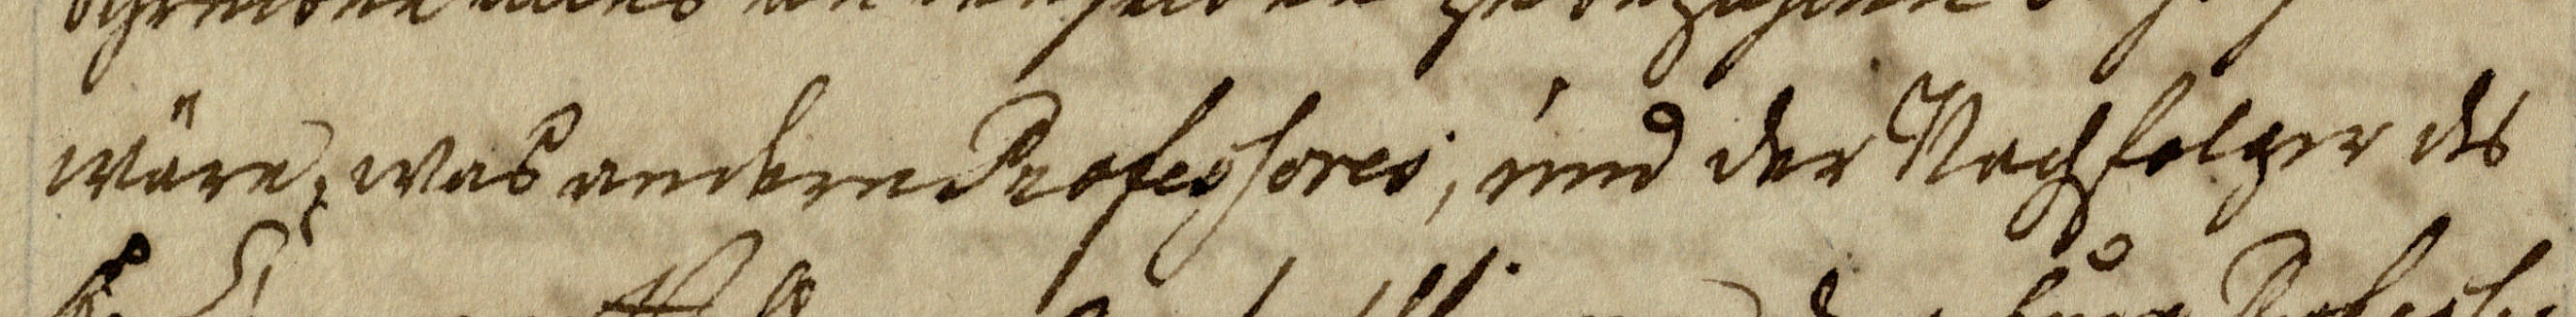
wäre, was andere Professores, und der Nachfolger des
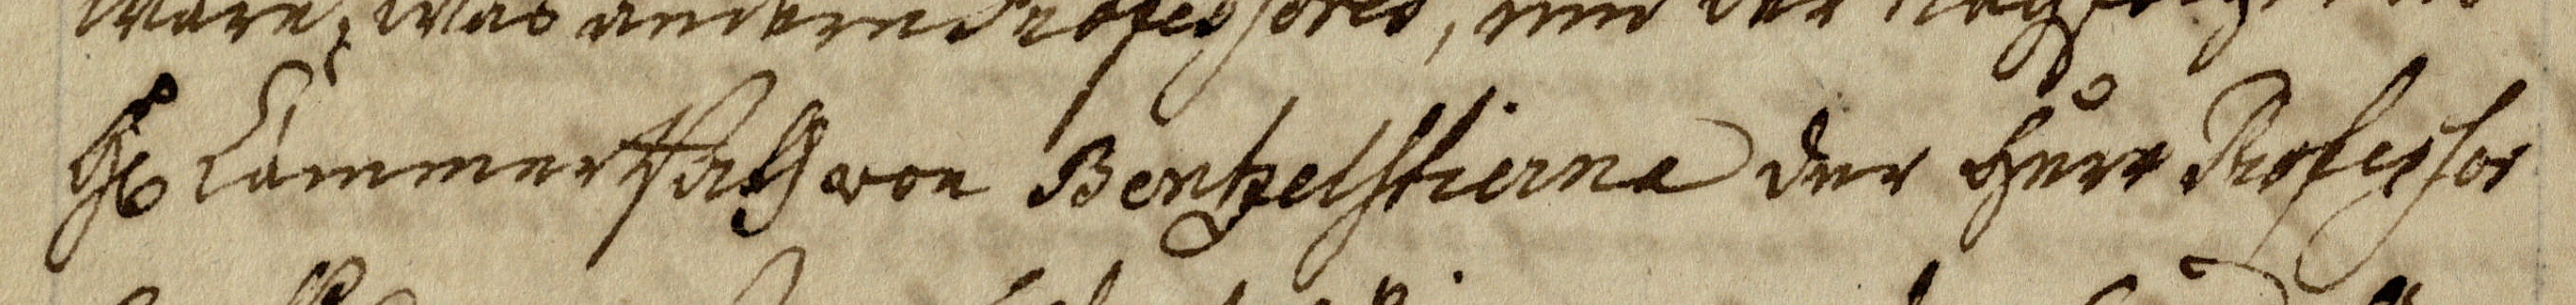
H. CammerRath von Bentzelstierna der Herr Professor
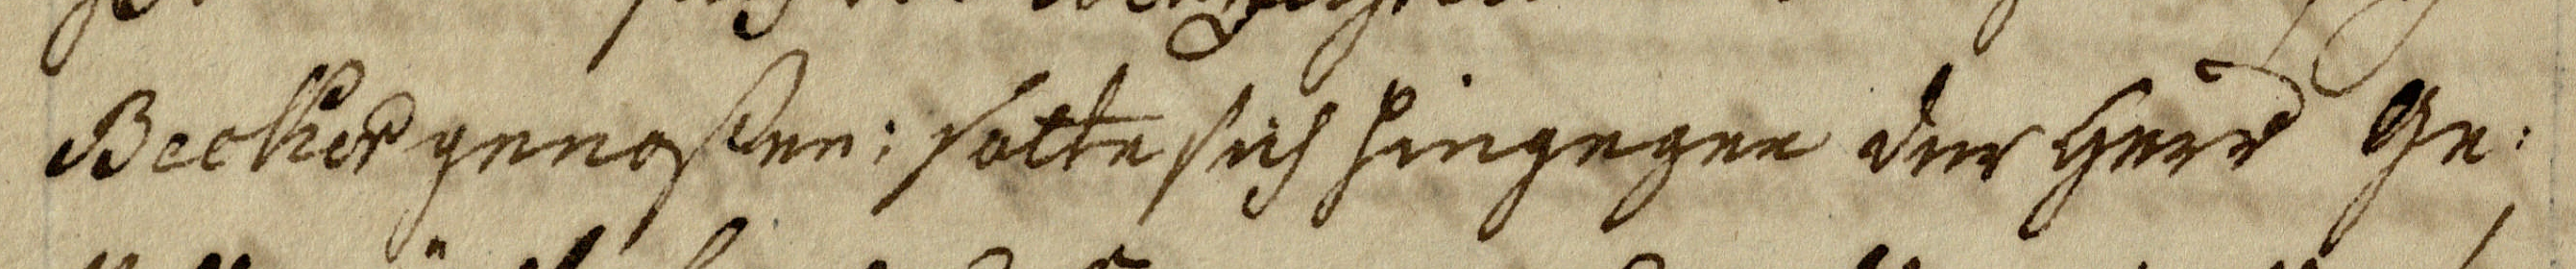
Becker genoßen, solte sich hingegen der Herr Ge¬
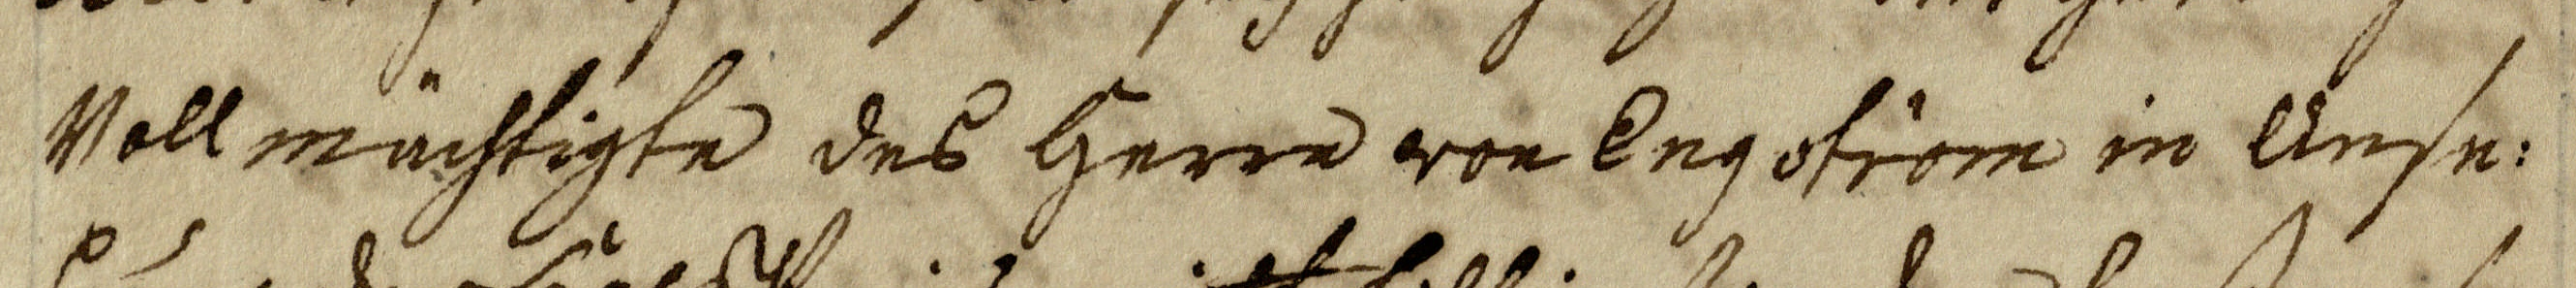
vollmächtigte des Herrn von Engström in Anse¬
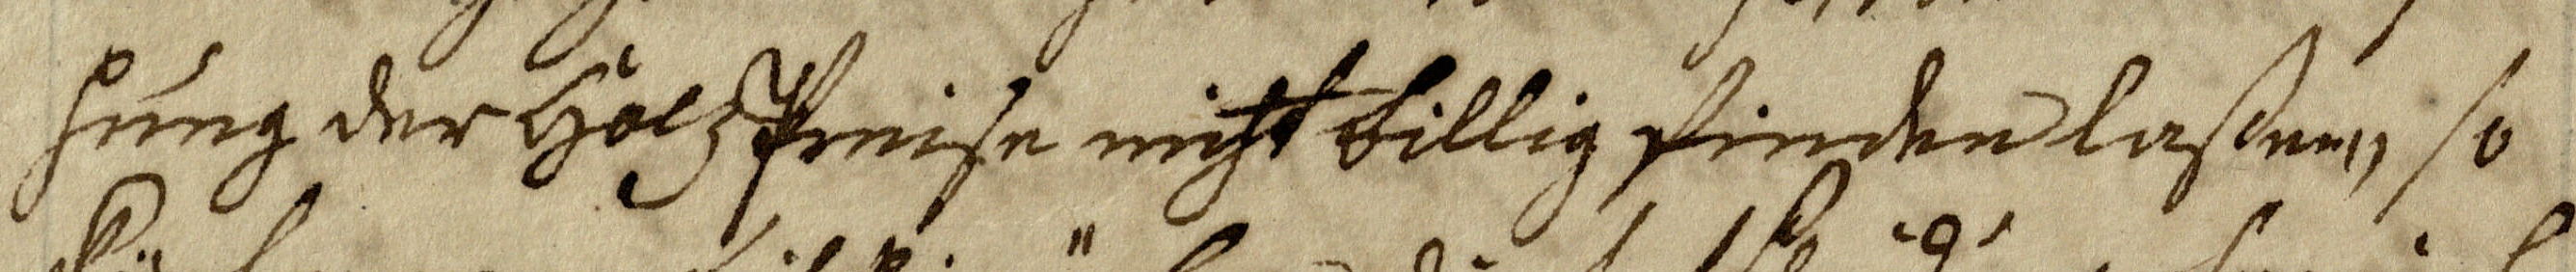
hung der HolzPreise nicht billig finden laßen, so
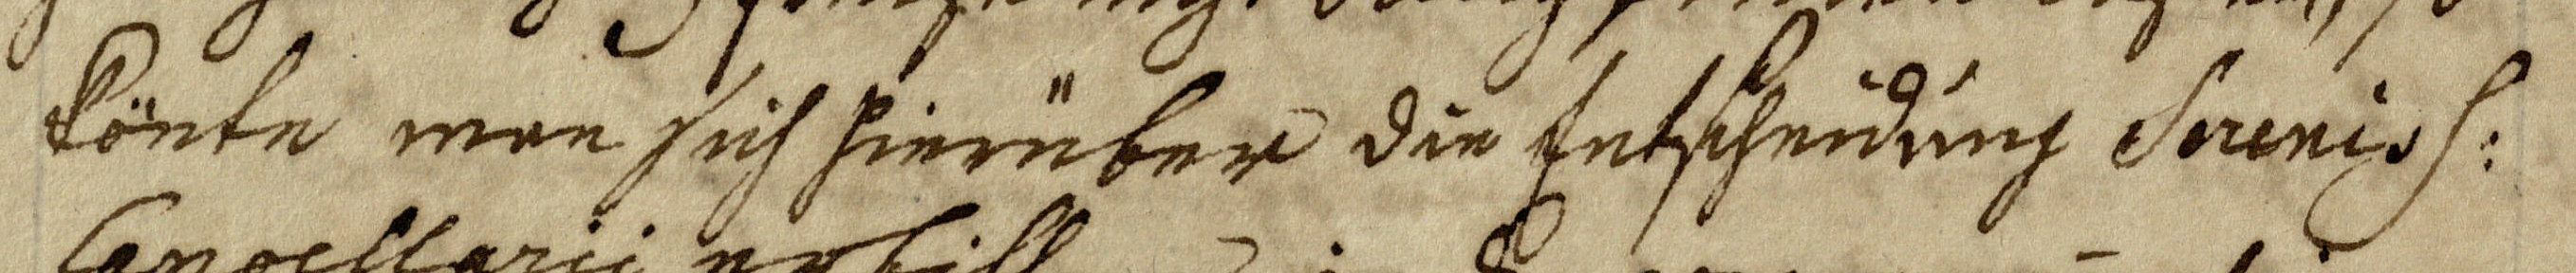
könte man sich hierüber die Entscheidung Sereniss.
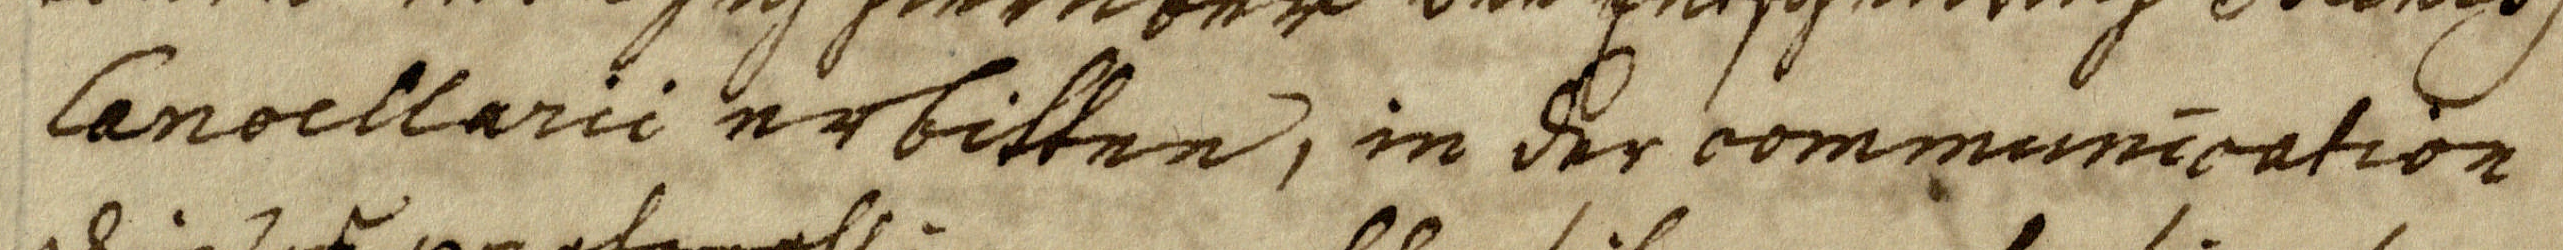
Cancellarii erbitten, in der comnmunication
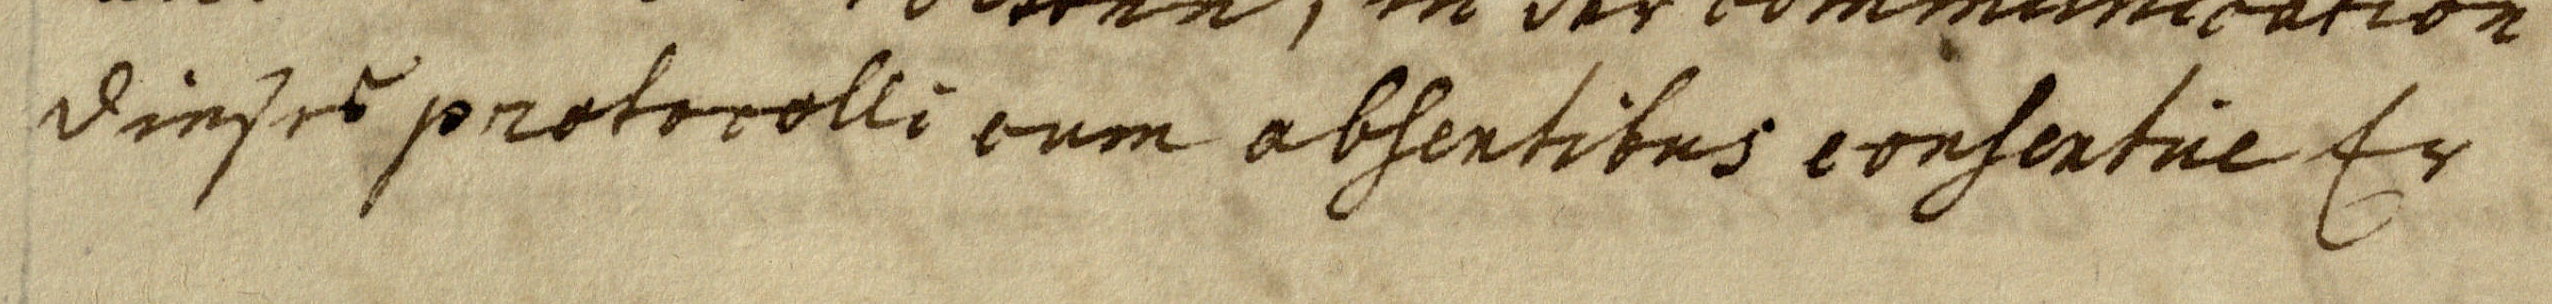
dieses protocolli cum absentibus consentire Er
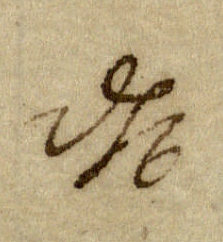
dh
